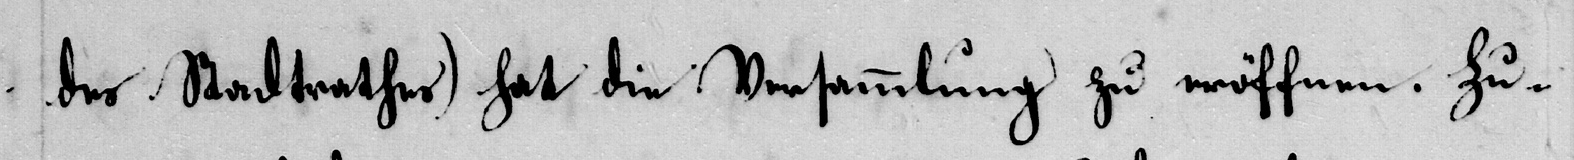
des Stadtrathes) hat die Versammlung zu eröffnen. Zu¬
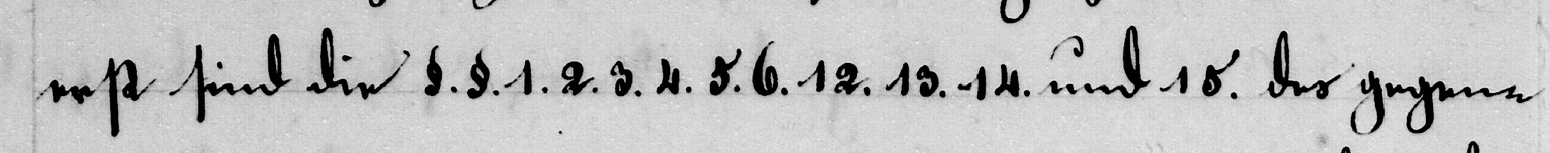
erst sind die §.§.1.2.3.4.5.6.12.13.14. und 15. des gegen¬
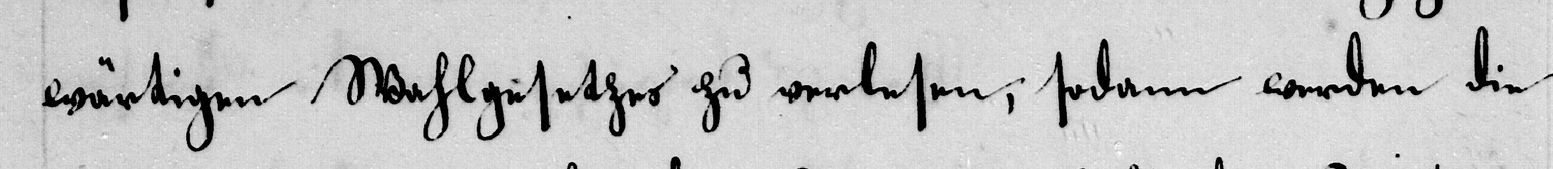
wärtigen Wahlgesetzes zu verlesen, sodann werden die
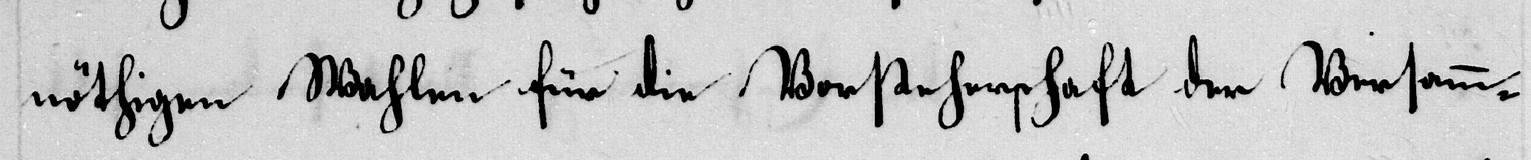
nöthigen Wahlen für die Vorsteherschaft der Versamm¬
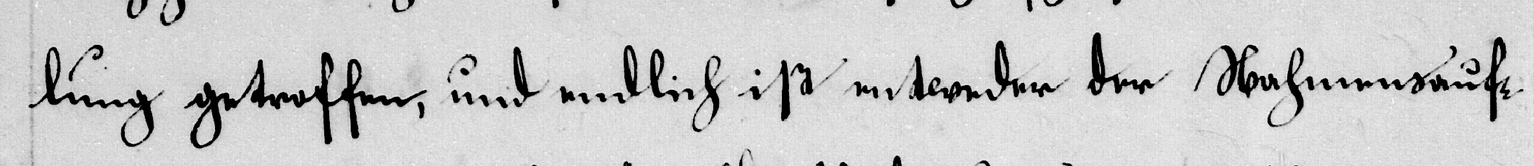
lung getroffen, und endlich ist entweder der Nahmensauf¬
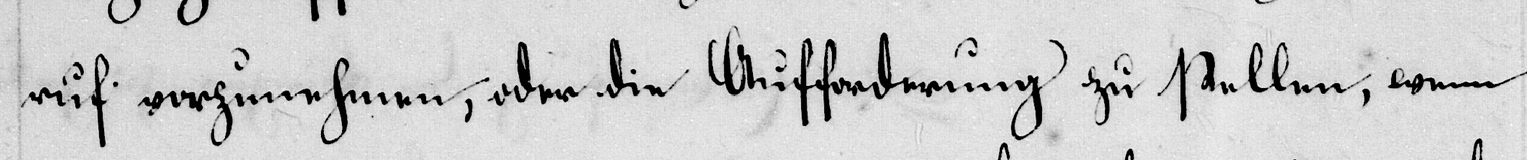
ruf vorzunehmen, oder die Aufforderung zu stellen, wenn
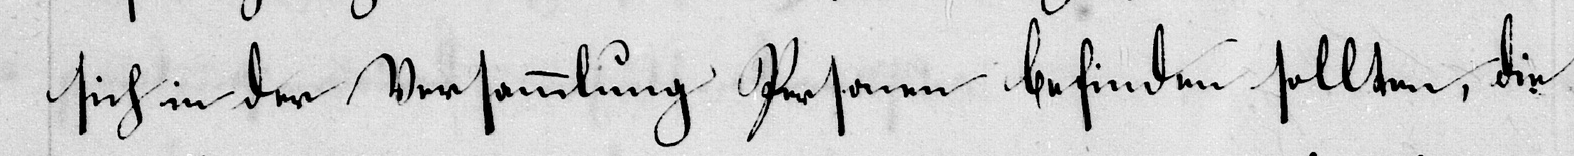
sich in der Versammlung Personen befinden sollten, die
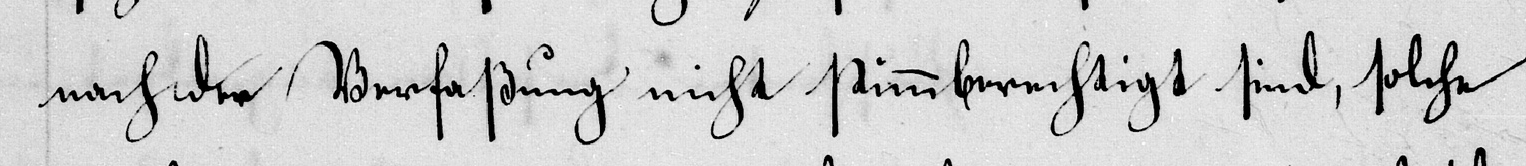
nach der Verfaßung nicht stimmberechtigt sind, solche
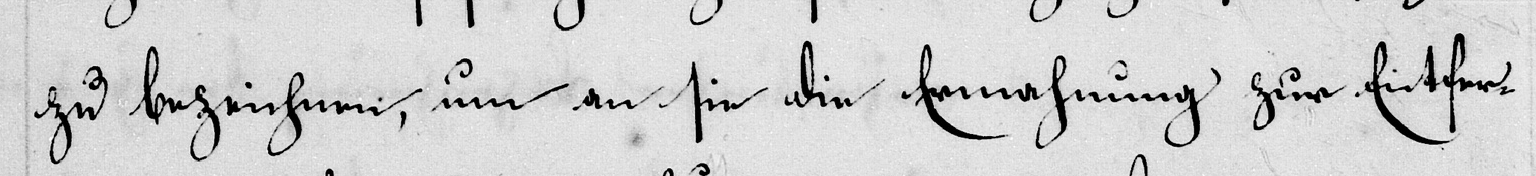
zu bezeichnen, um an sie die Ermahnung zur Entfer¬
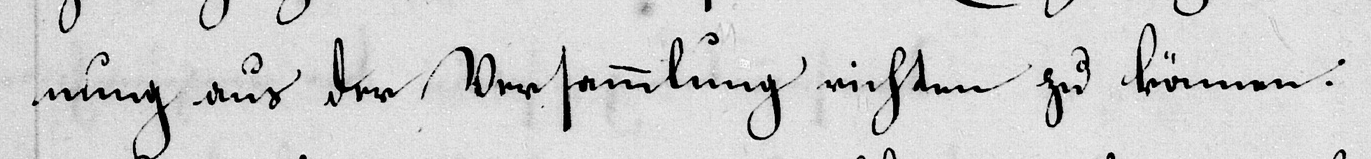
nung aus der Versammlung richten zu können.
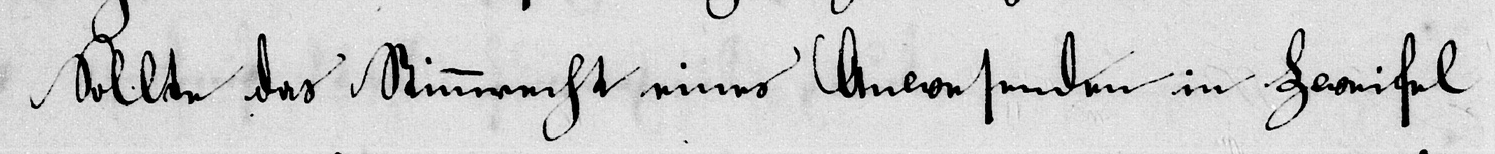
Sollte das Stimmrecht eines Anwesenden in Zweifel
